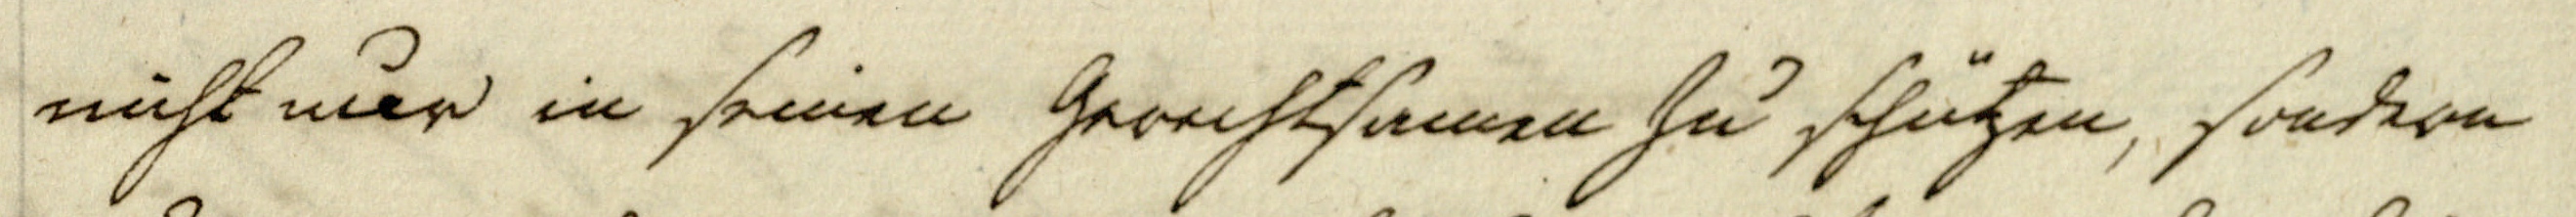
nicht nur in seinen Gerechtsamen zu schützen, sondern
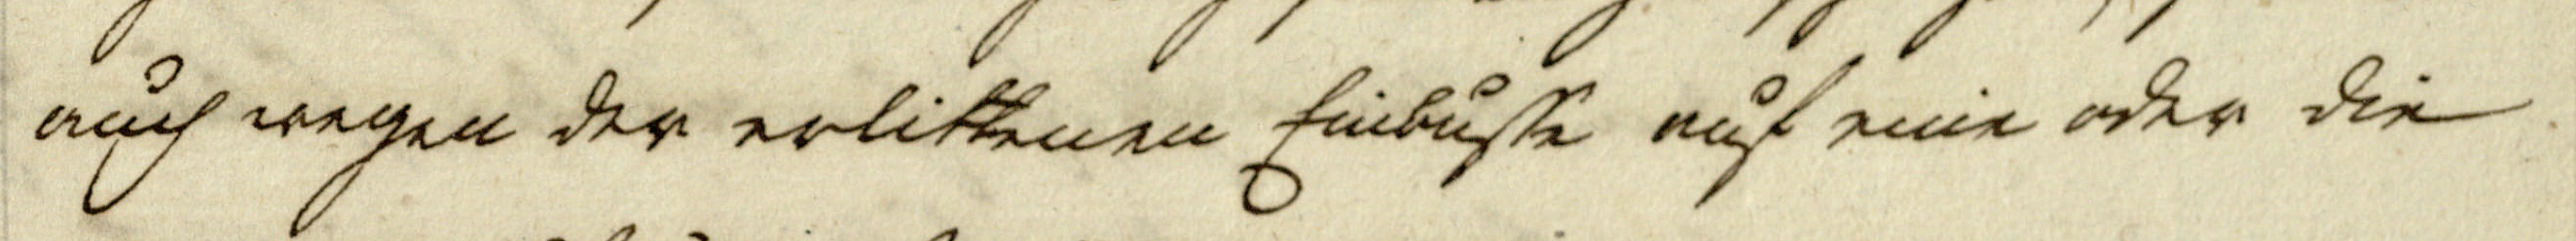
auch wegen der erlittenen Einbusse auf eine oder die
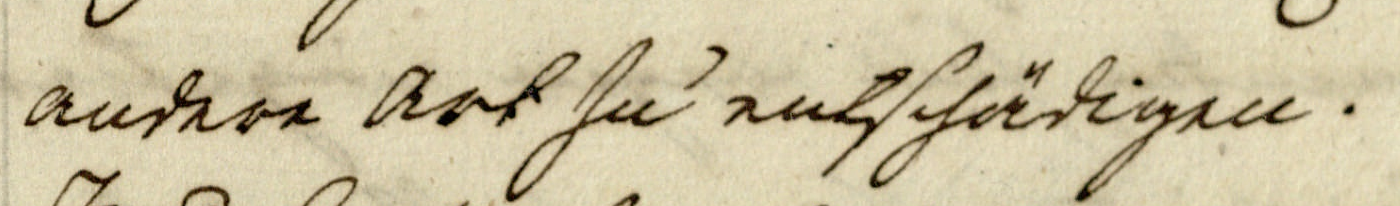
andere Art zu entschädigen.
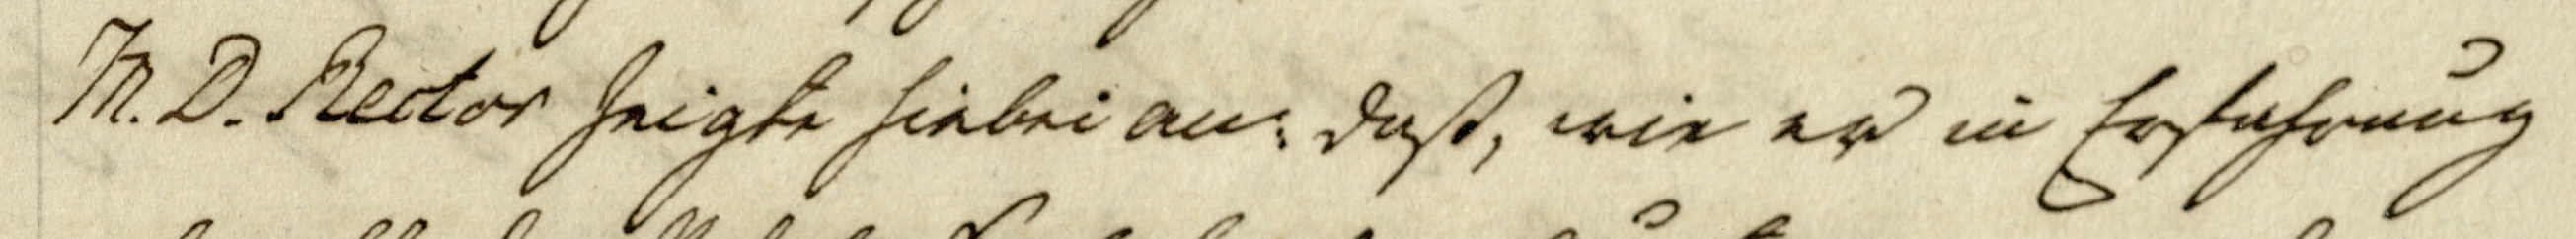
M. D. Rector zeigte hiebei an: daß, wie er in Erfahrung
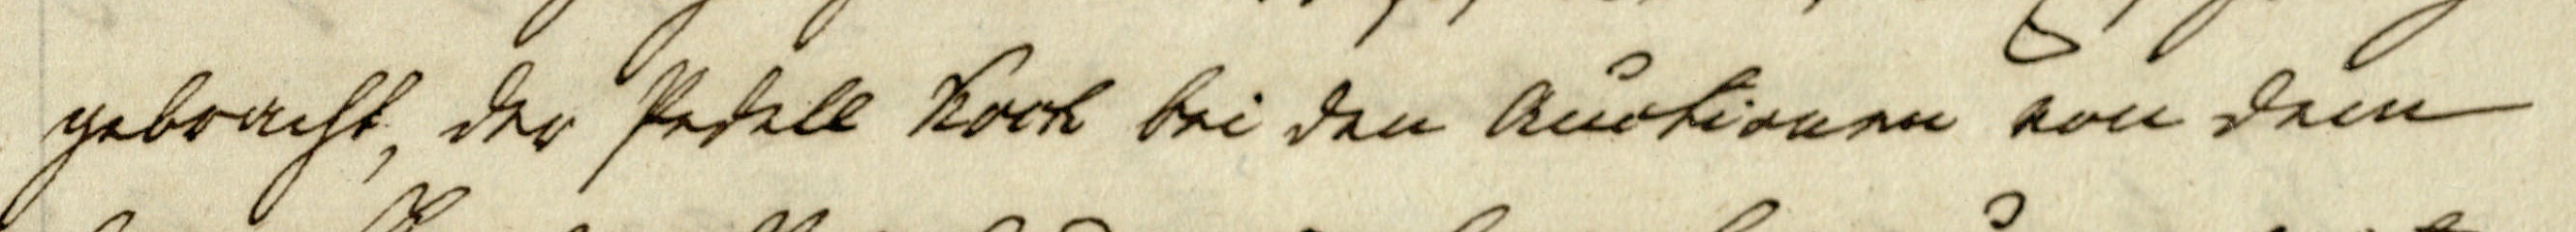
gebracht, der Pedell Koch bei den Auctionen von dem
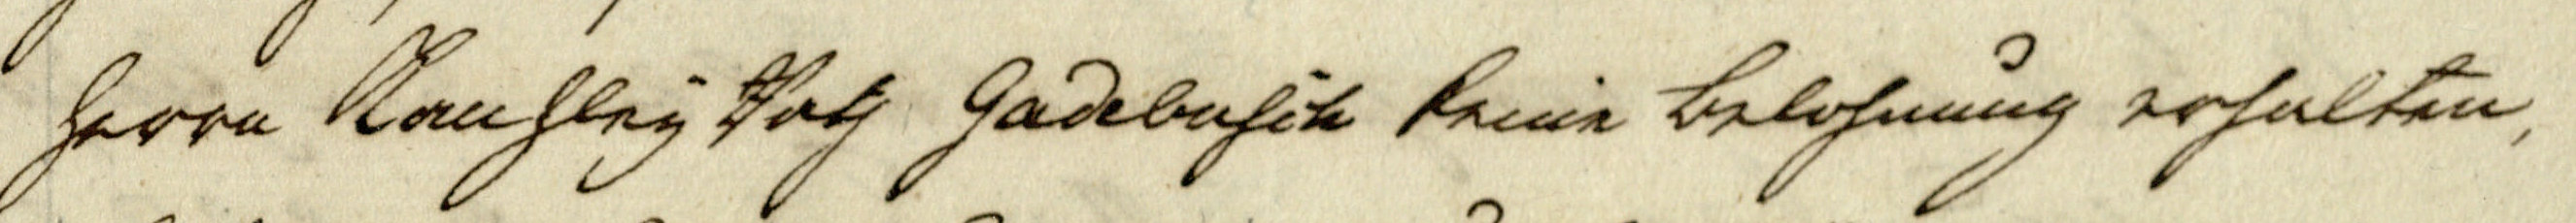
herrn Kanzleÿ Rath Gadebusch keine Belohnung erhalten,
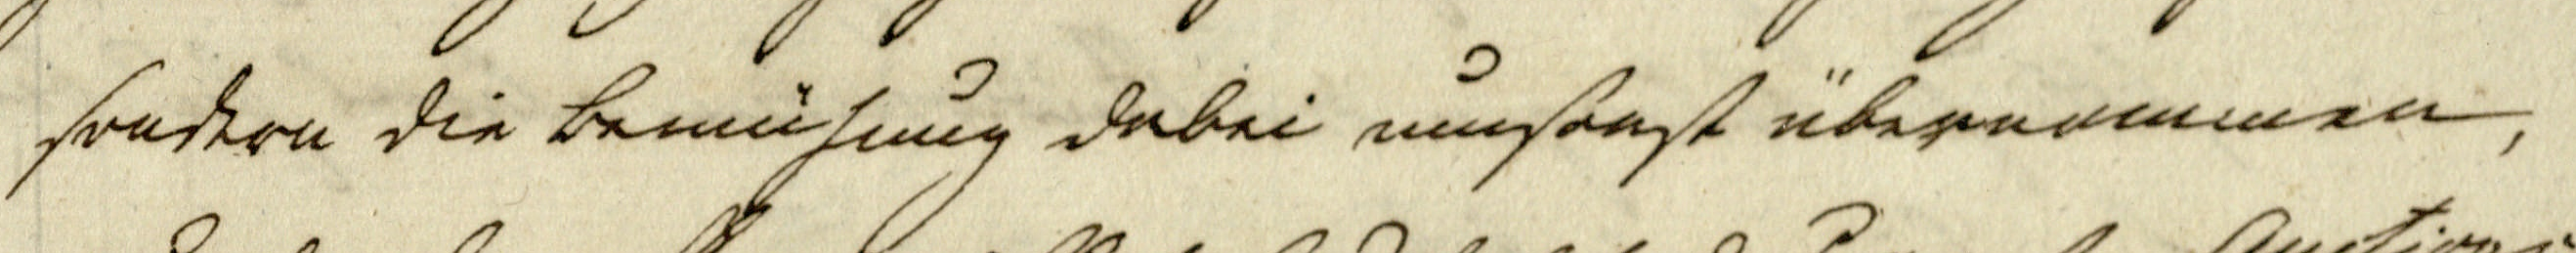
sondern die Bemühung dabei umsonst übernommen,
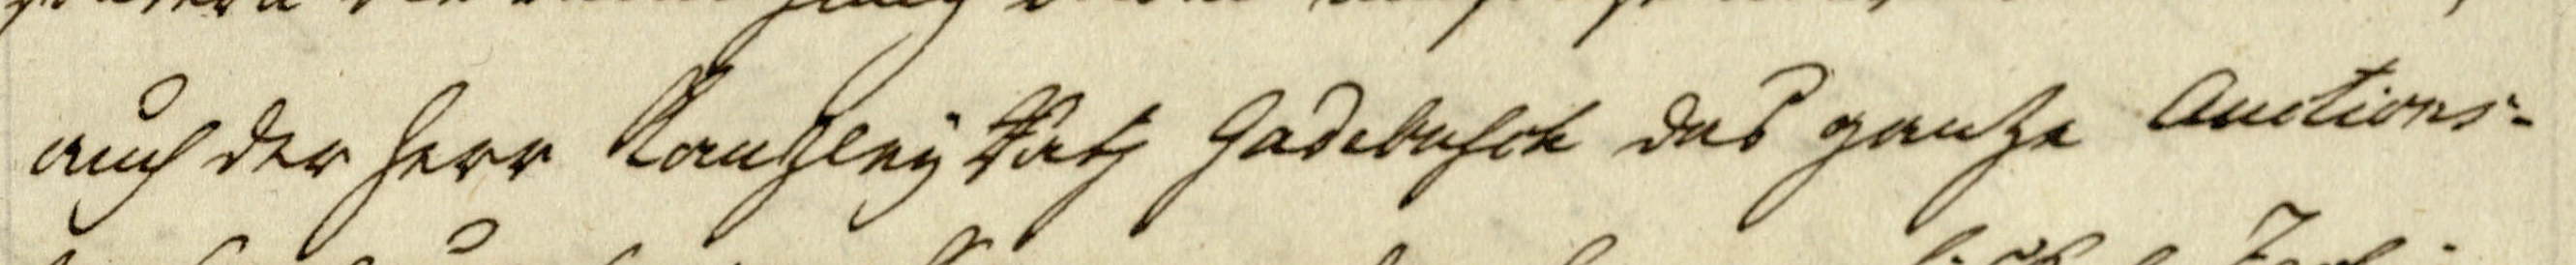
auch der herr Kanzleÿ Rath Gadebusch das ganze Auctions¬
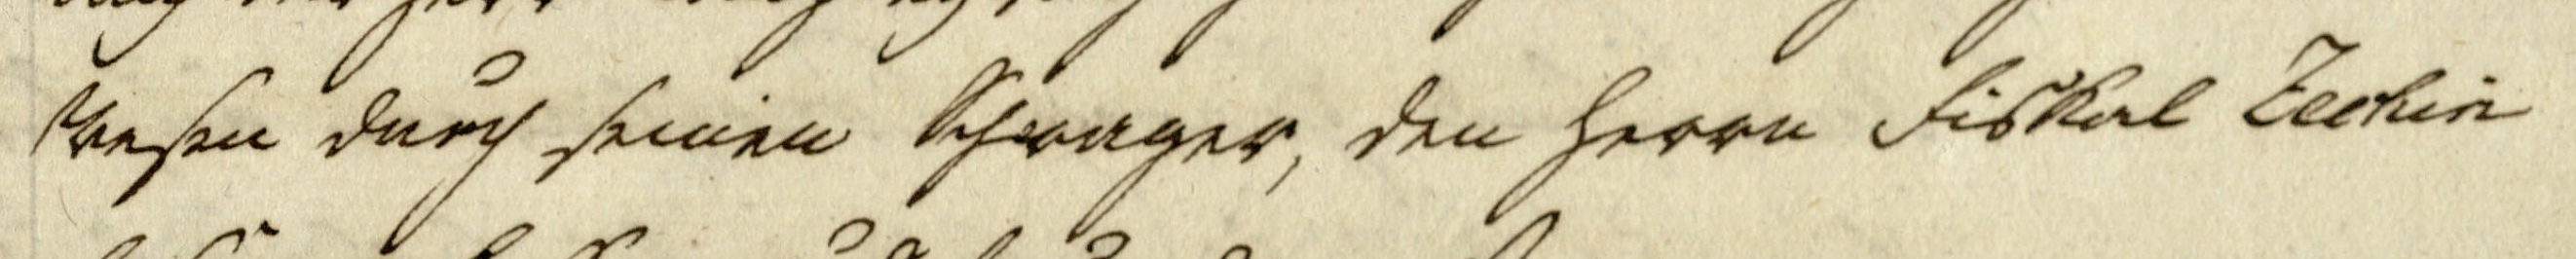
Wesen durch seinen Schwager, den herrn Fiskal Zechin
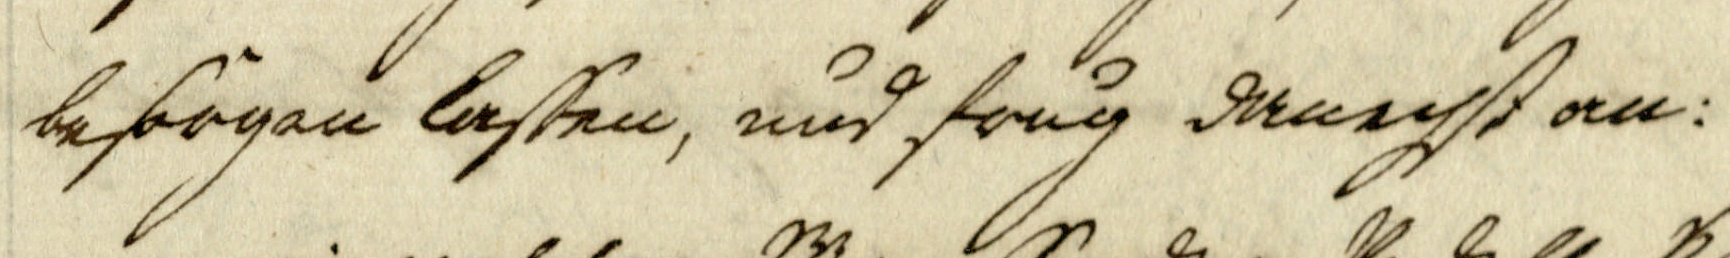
besorgen lassen, und frug danechst an:
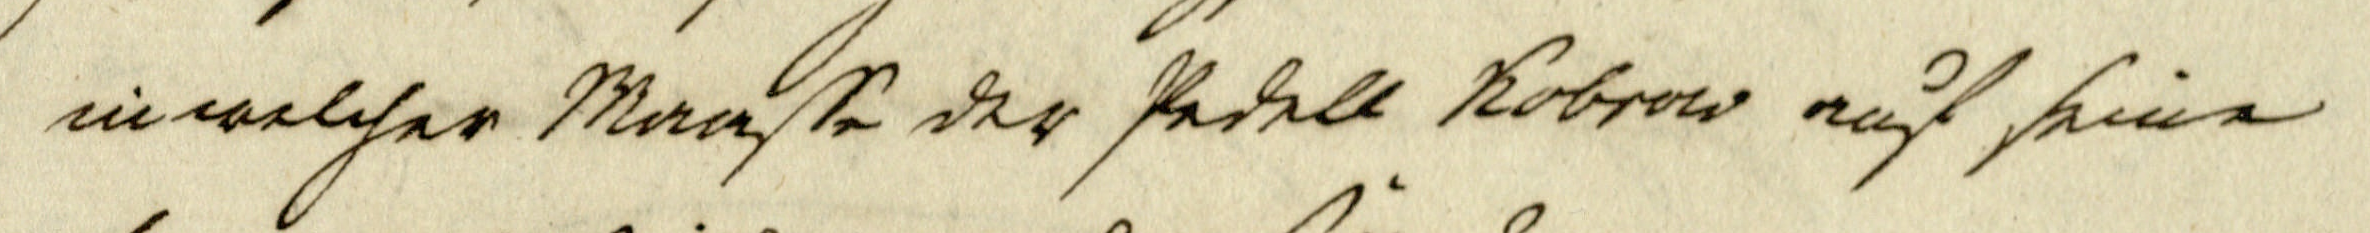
in welcher Maasse der Pedell Kobrow auf seine
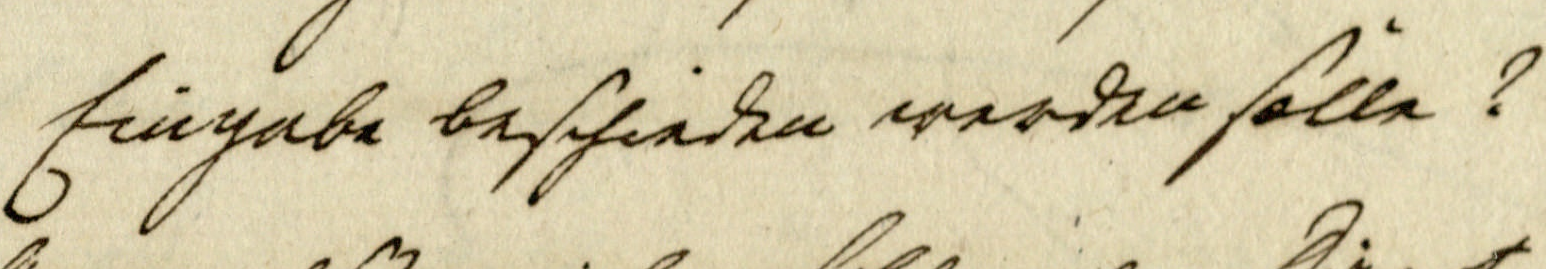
Eingabe beschieden werden solle?
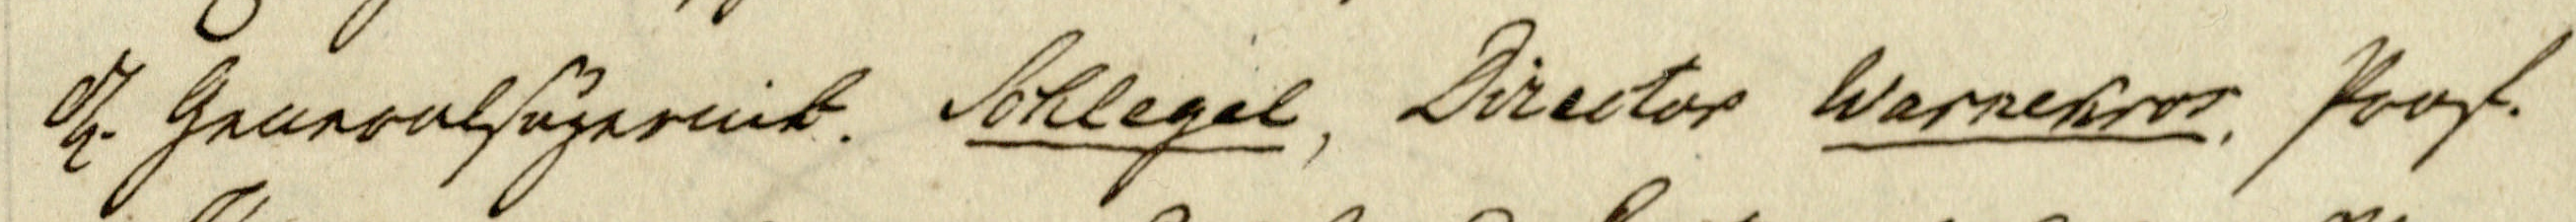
dh. Generalsuperint. Schlegel, Director Warnekros, Prof.
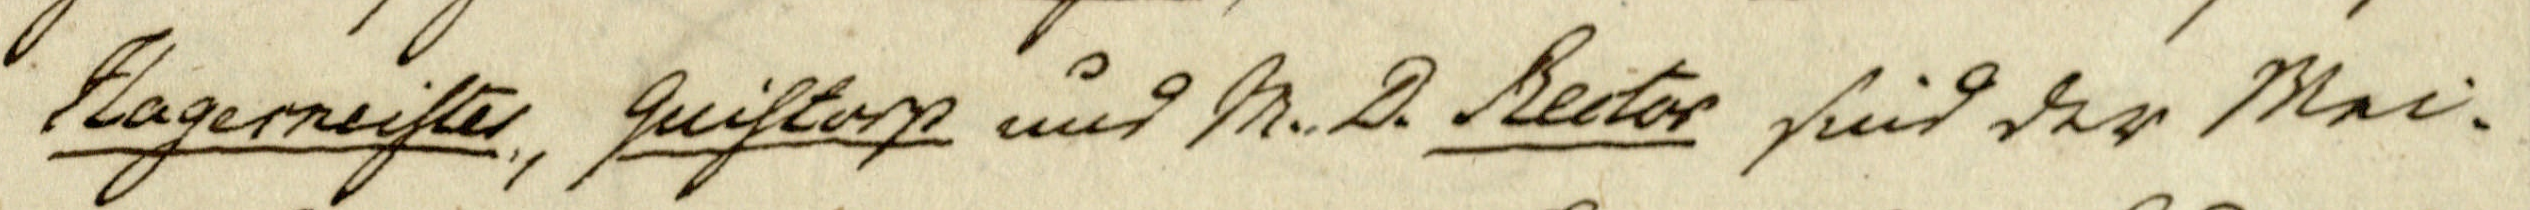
Hagemeister, Quistorp und M. D. Rector sind der Mei¬
